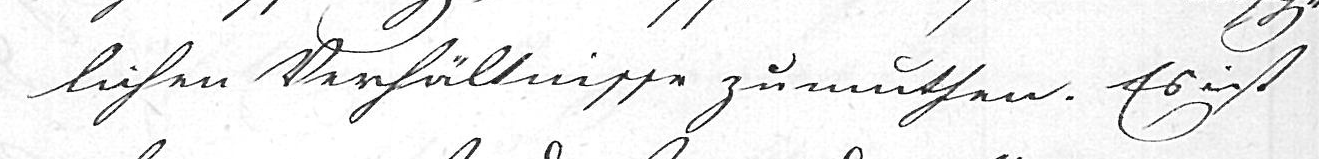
lichen Verhältnisse zumuthen. Es ist
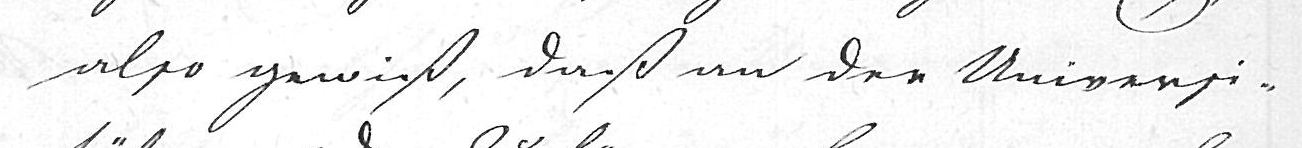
also gewiß, daß an der Universi-
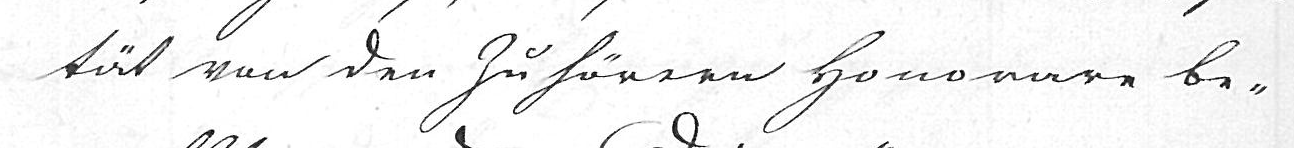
tät von den Zuhörern Honorare be-
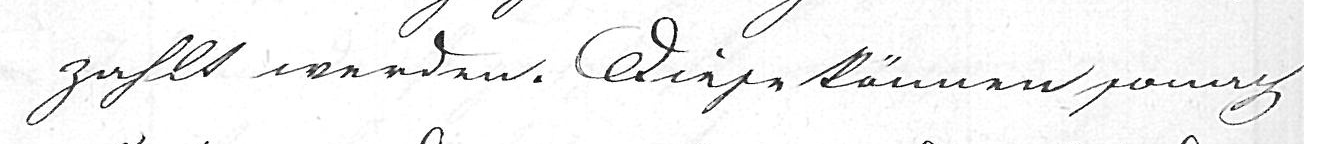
zahlt werden. Diese können sonach
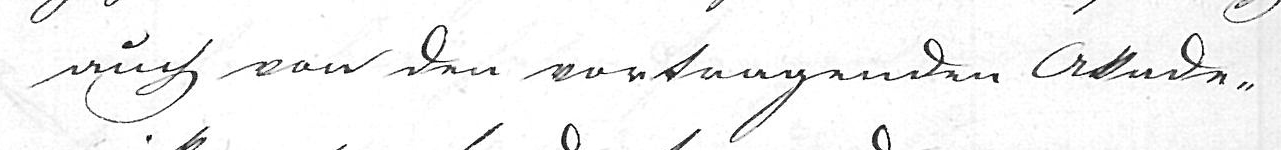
auch von den vortragenden Akade-
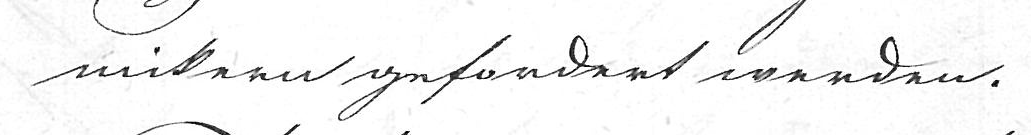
mikern gefordert werden.
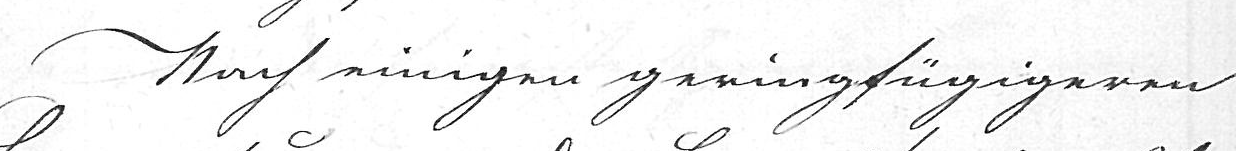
Nach einigen geringfügigeren
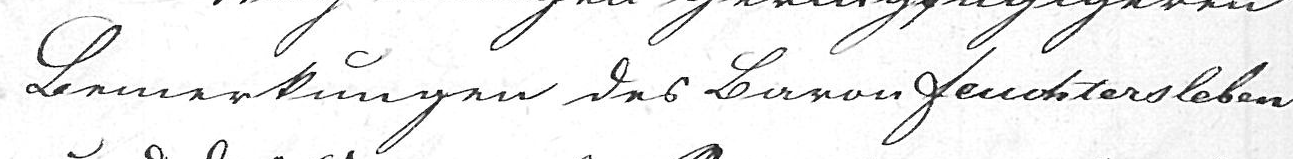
Bemerkungen des Baron Feuchtersleben
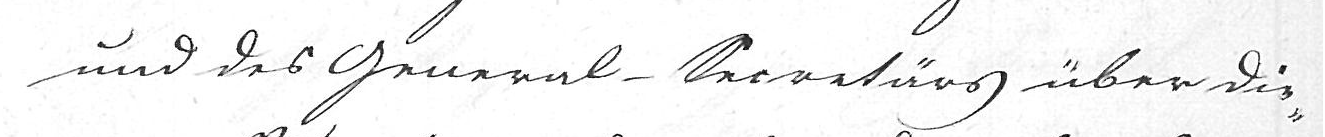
und des General-Secretärs über die-
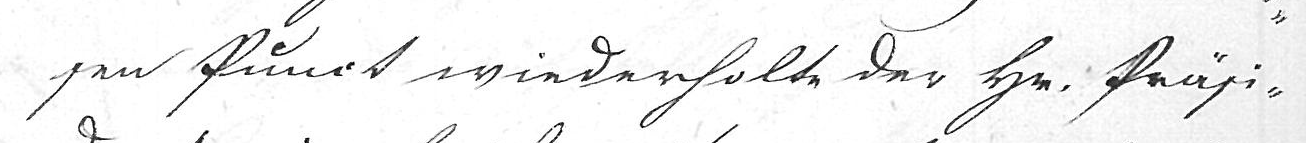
sen Punct wiederholt der Hr. Präsi-
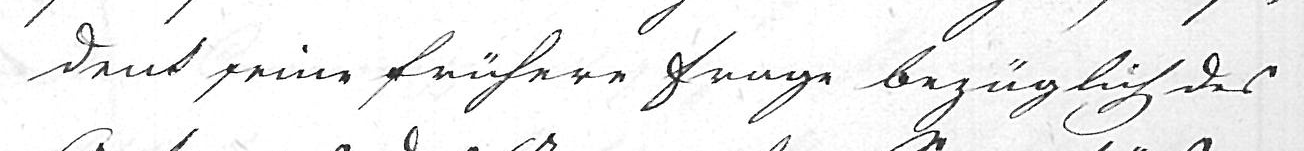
dent seine frühere Frage bezüglich des
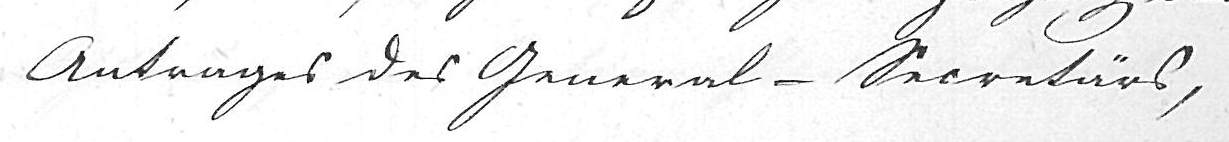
Antrages des General-Secretärs,
